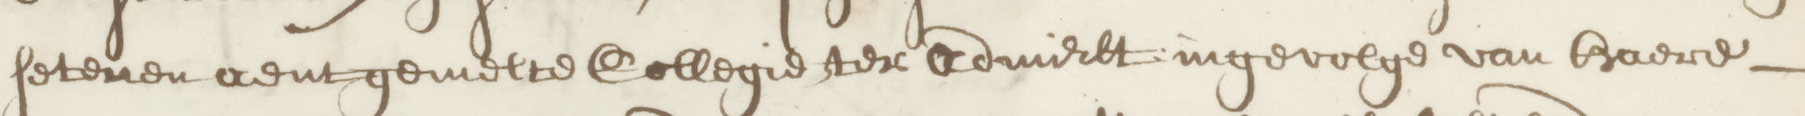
setenen aent gemelte Collegie ter Admirlt: ingevolge van haere —
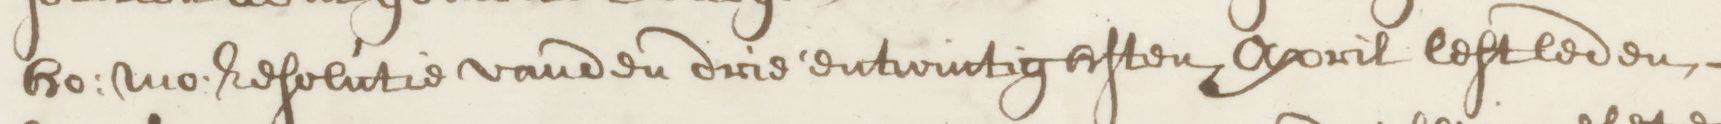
Ho:Mo: resolutie vanden drie 'entwintighsten, April lestleden,
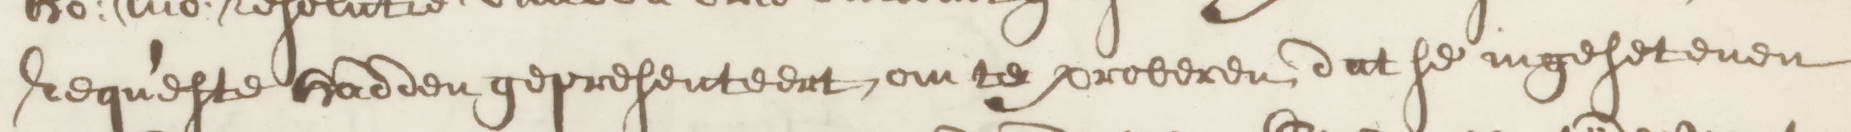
requeste hadden gepresenteert, om te proberen, dat se ingehetenen
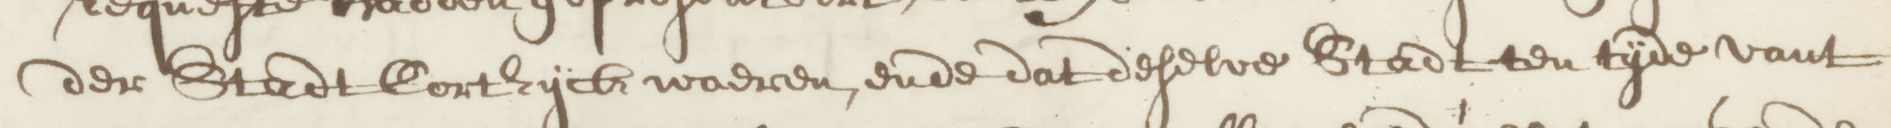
der Stadt Cortrijck waeren, ende dat deselve Stadt ten tijde vant
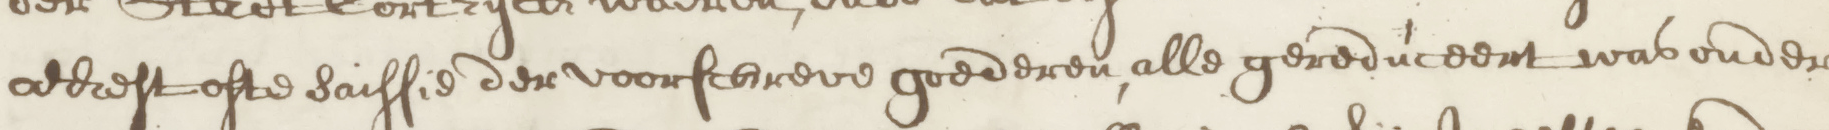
arrest ofte saissie der voorschreve goederen alle gereduceert was onder
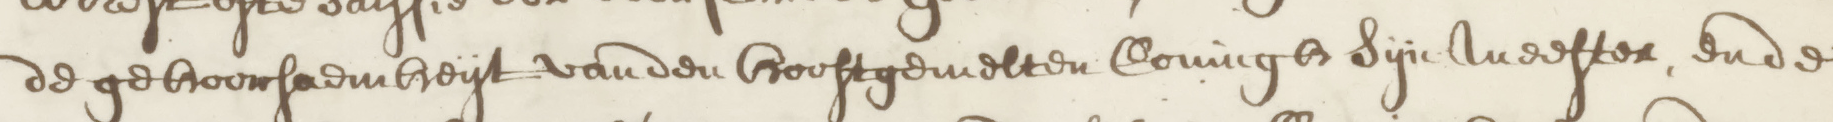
de gehoorsaemheijt van den Hoostgemelten Coningh Sijn meester, ende
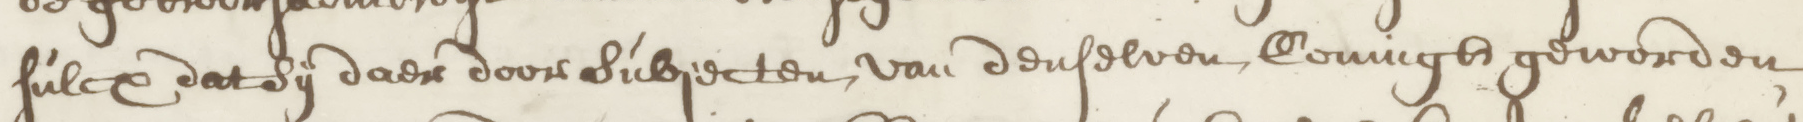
sulcx dat sij daer door subjecten, van denselven, Coningh geworden
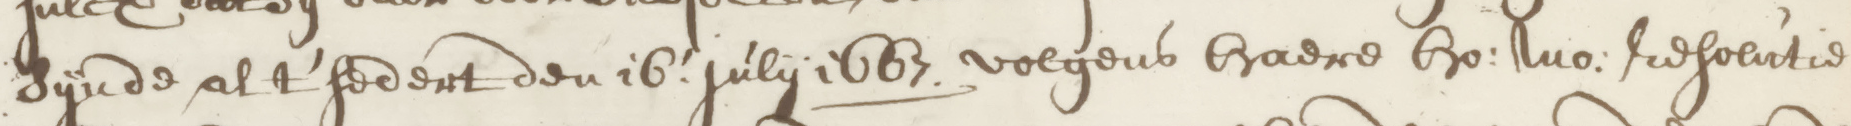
Sijnde al t` sedert den 16: julij 1667 volgens haere Ho:Mo: resolutie
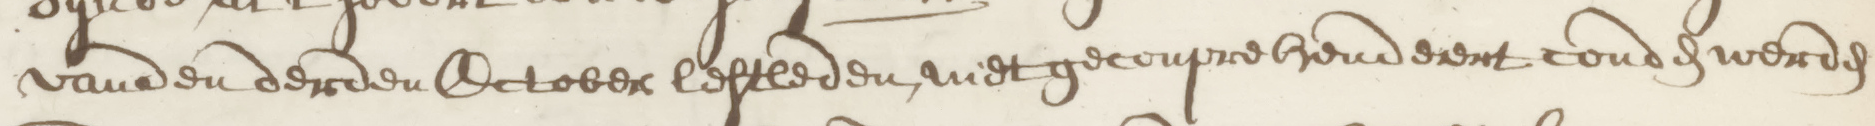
vanden derden October lestleden, niet geconprehendeert conden werden
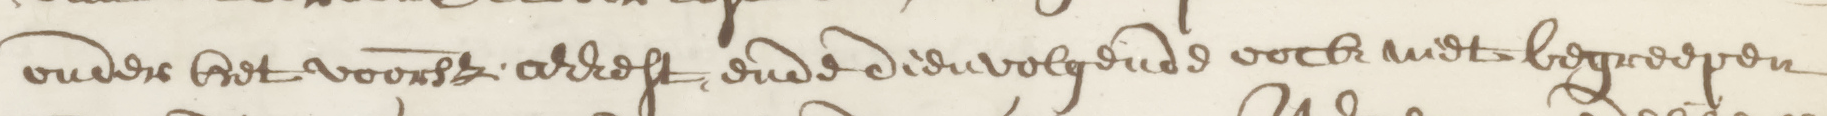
onder het voorsr. arrest, ende dienvolgende oock niet begreepen
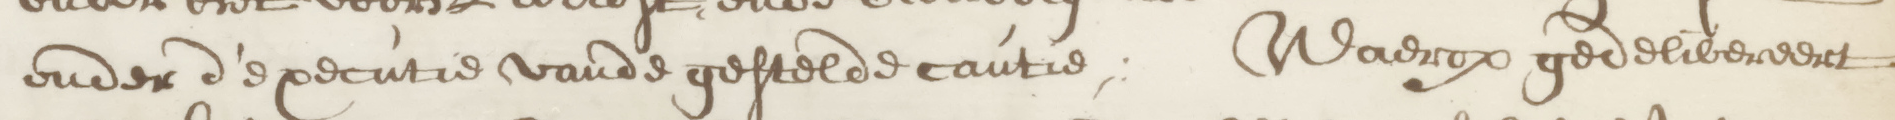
onder d'executie vande gestelde cautie; Waerop gedelibereert
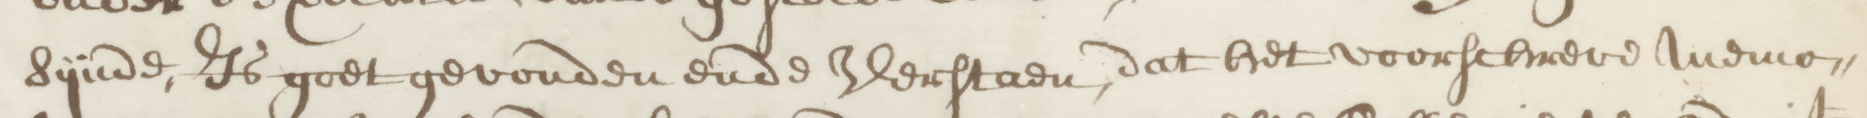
sijnde, Is goet gevonden ende verstaen, dat het voorschreve memo„
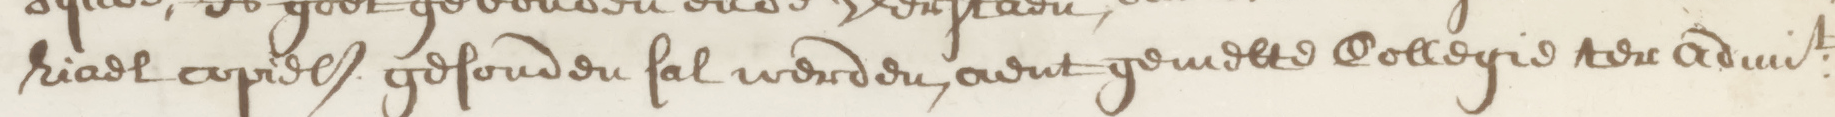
riael copiel gesonden sal werden aent gemelte Collegie ter Admit:
